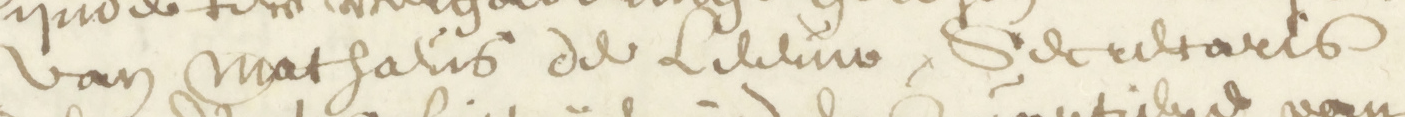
van mathaeus de Leeuw, Secretaris
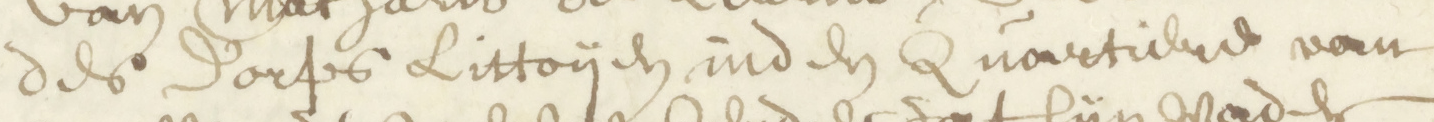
des Dorps Littoijen inden Quartiere van
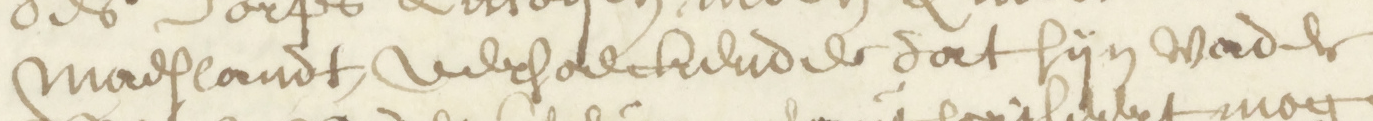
maeslandt, versoeckende dat sijn vader
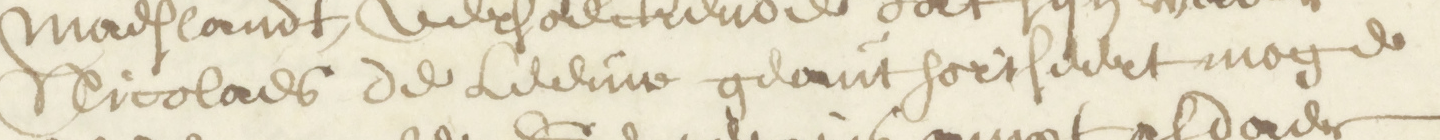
Nicolaes de Leeuw geauthoriseert moge
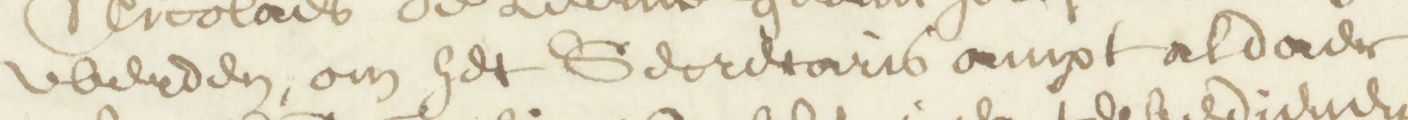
werden, om het Secretaris ampt aldaer
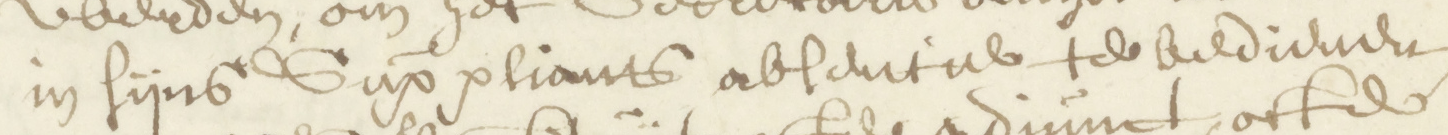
in sijns Suppliants absentie te bedienen
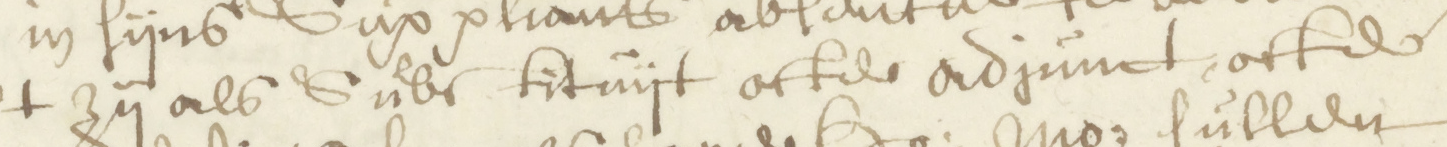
't zij als Substituijt ofte adjunct, ofte
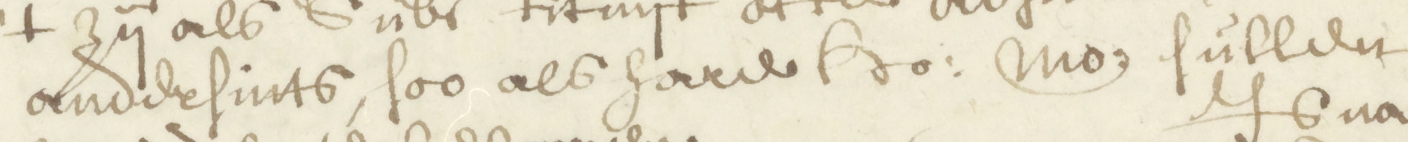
andersints, soo als hare Ho:Mo: sullen
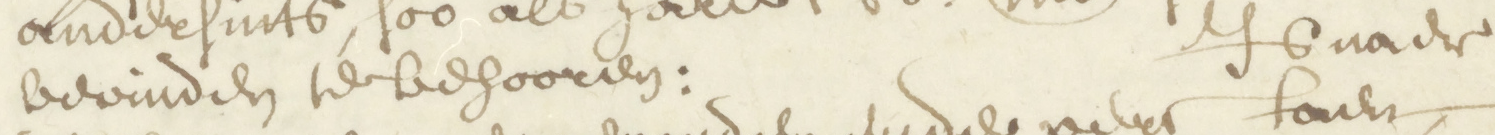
bevinden te behooren: Is naer
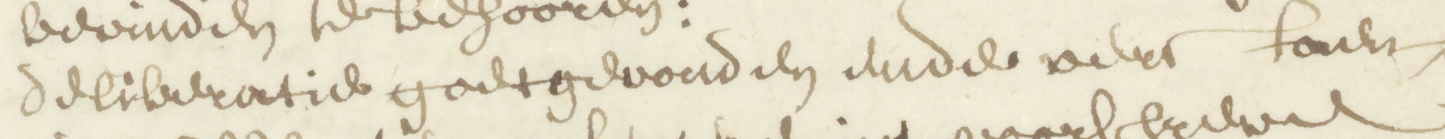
deliberatie goetgevonden ende verstaen
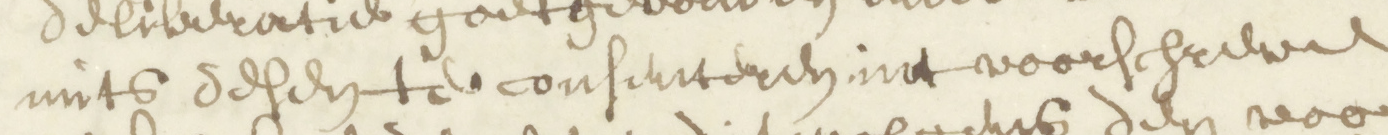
mits desen te consenteren int voorschreve
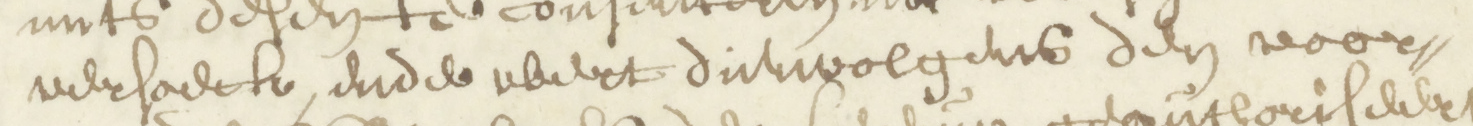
versoeck, ende wert dienvolgens den voor,,
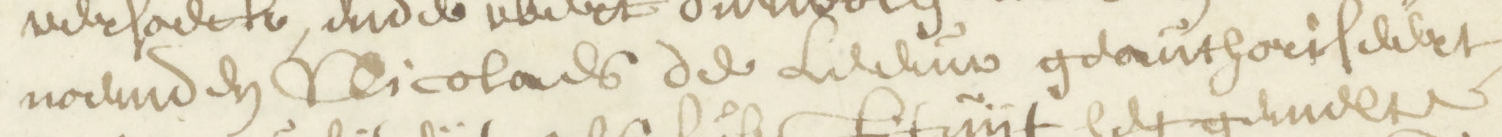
noemden Nicolaes de Leeuw geauthoriseert,
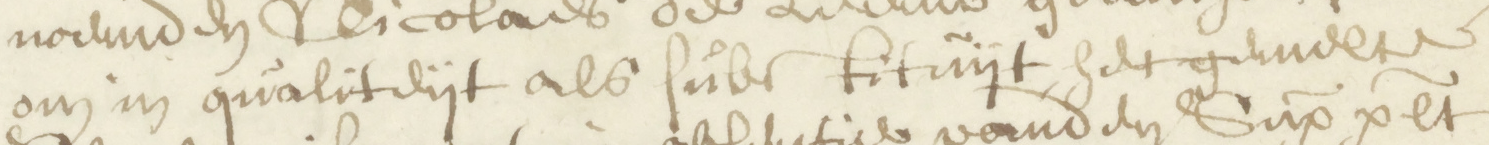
om in qualiteijt als substituijt, het gemelte
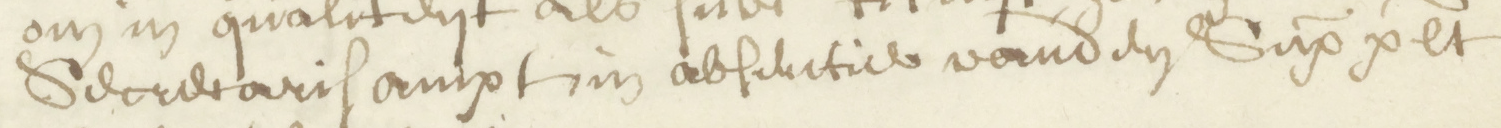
Secretarisampt in absentie vanden Supplt
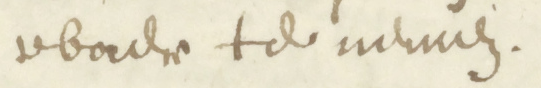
waer te nemen.
